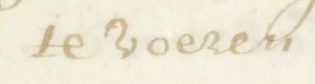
te voeren
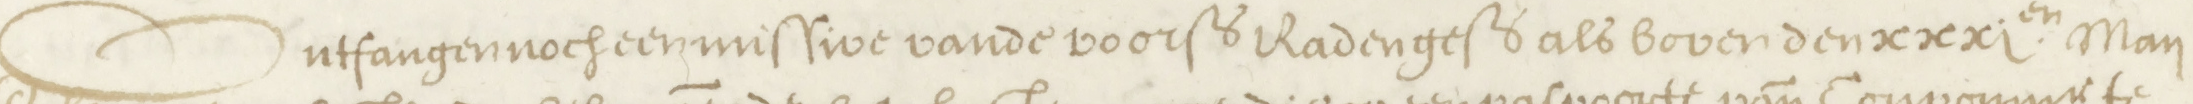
Ontfangen noch een missive vande voors Raden ges als boven den xxxjen. May
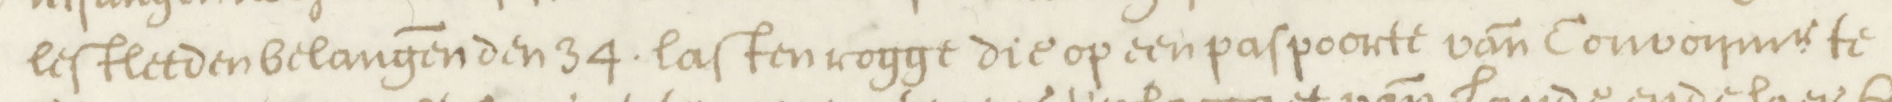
lestleeden belangen den 34. lasten rogge die op een paspoorte van Convoymr. te
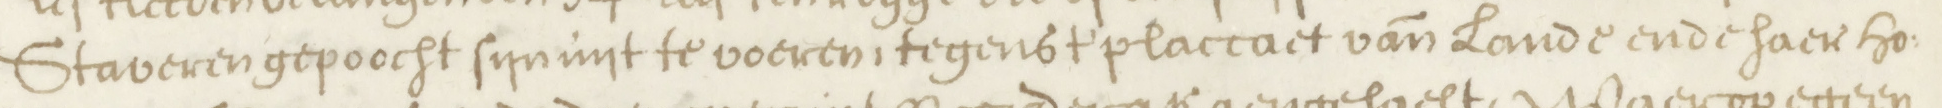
Staveren gepoocht syn uyt te voeren, tegens t' placcaet van Lande ende haer Ho:
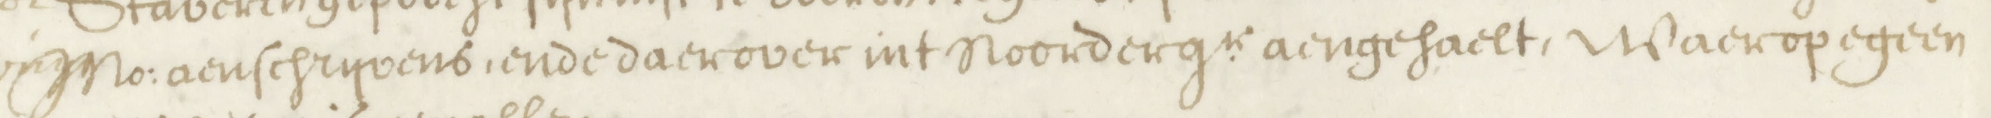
Mo: aenschryvens, ende daerover int Noorderqr. aengehaelt. Waerop egeen
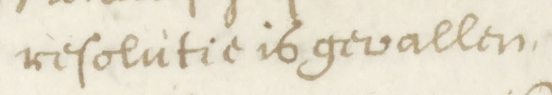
resolutie is gevallen.
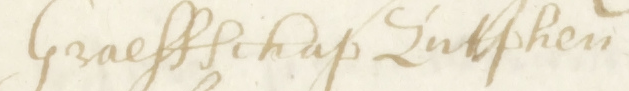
Graeffschap Zutphen
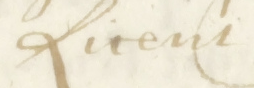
Licent
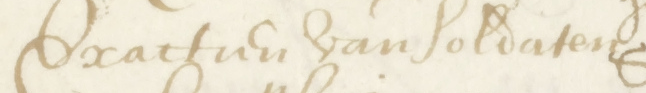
Exactien van soldaten
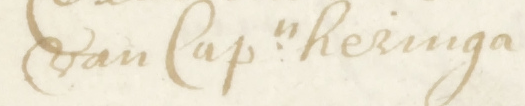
van Capn. heringa
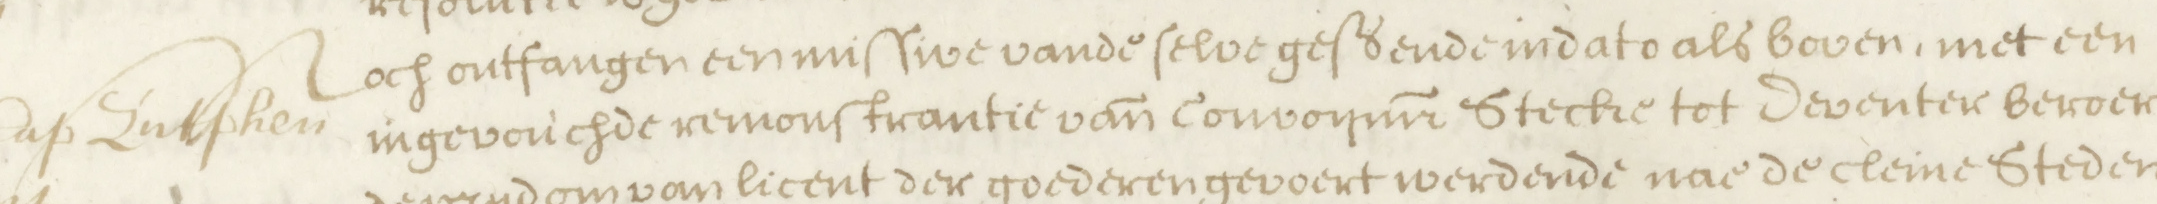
Noch ontfangen een missive vande selve ges ende indato als boven, met een
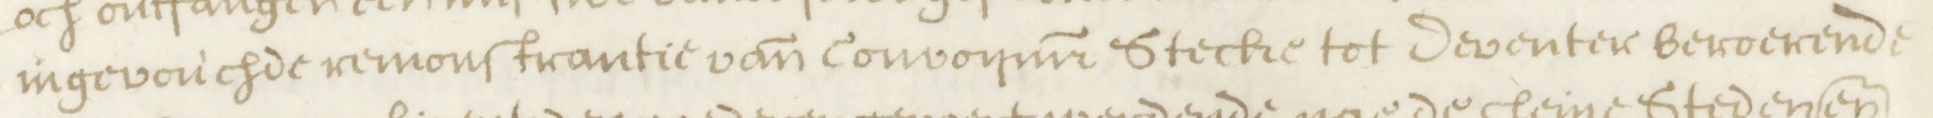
ingevouchde remonstrantie van convoymr Stecke tot Deventer beroerende
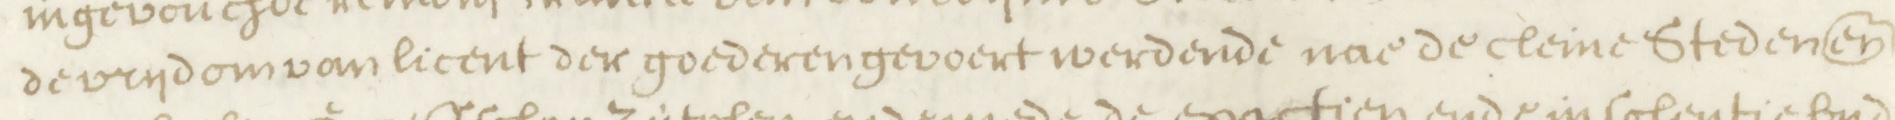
de vrydom van licent der goederen gevoert werdende nae de cleine Steden en
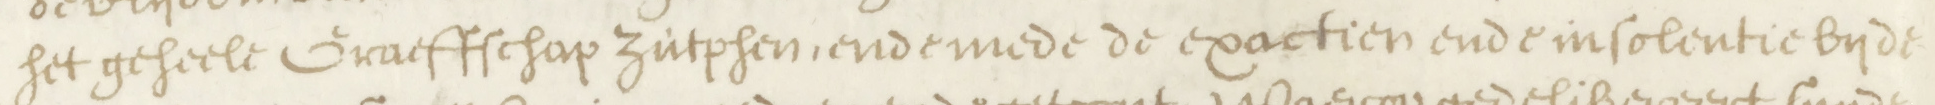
het geheele Graeffschap zutphen, ende mede de exactien ende insolentie by de
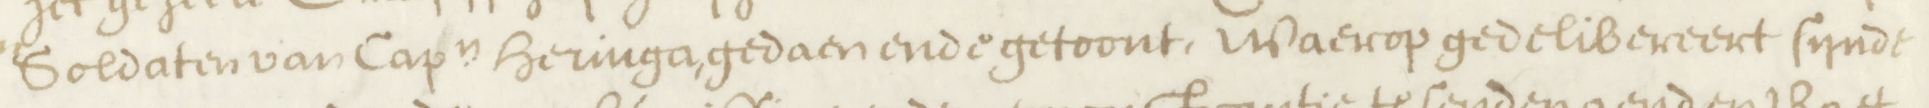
Soldaten van Capn heringa, gedaen ende getoont. Waerop gedelibereert synde
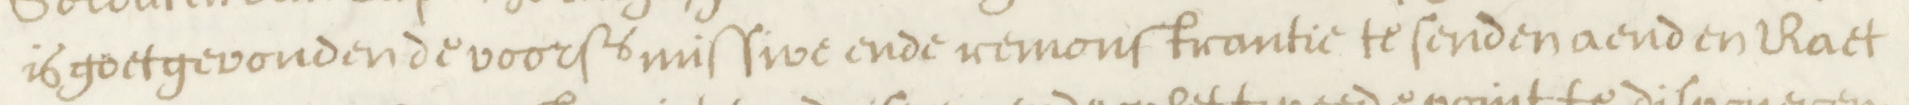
is goetgevonden de voors missive ende remonstrantie te senden aenden Raet
